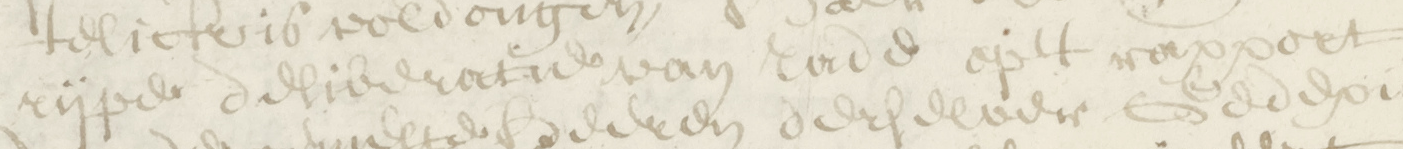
rijpe deliberatie van rade op't rapport
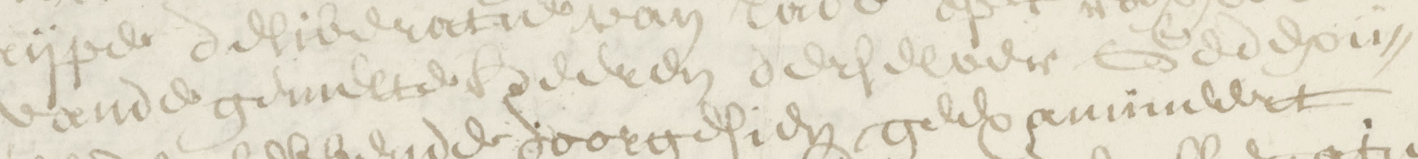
vande gemelte Heeren derselver Gedepu„
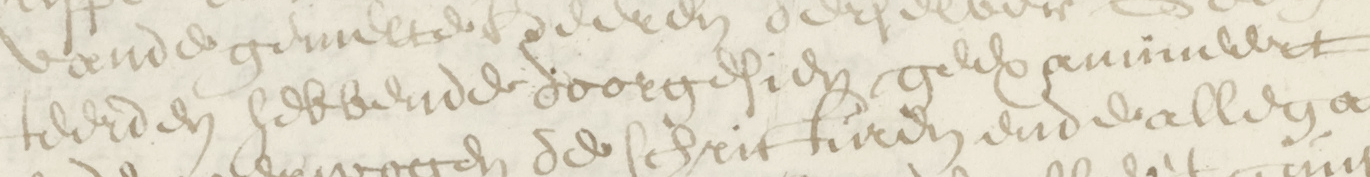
teerden hebbende doorgesien, geexamineert
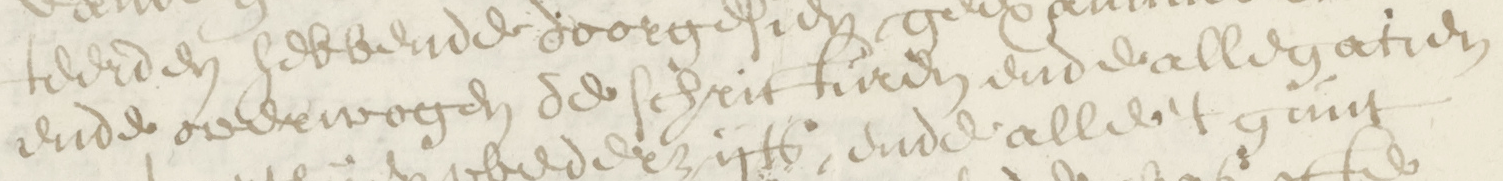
ende overwogen de schrifturen ende allegatien
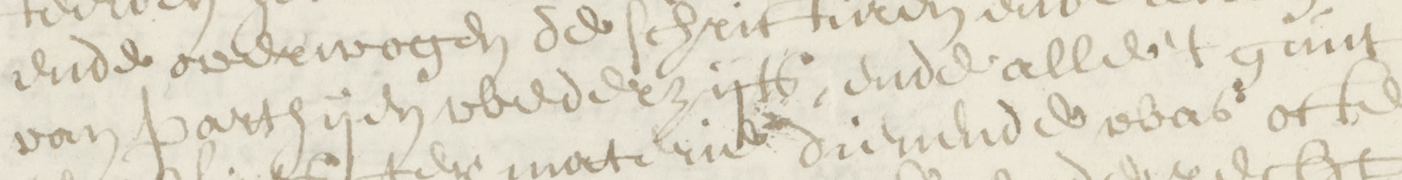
van parthijen wederzijts, ende alle 't gunt
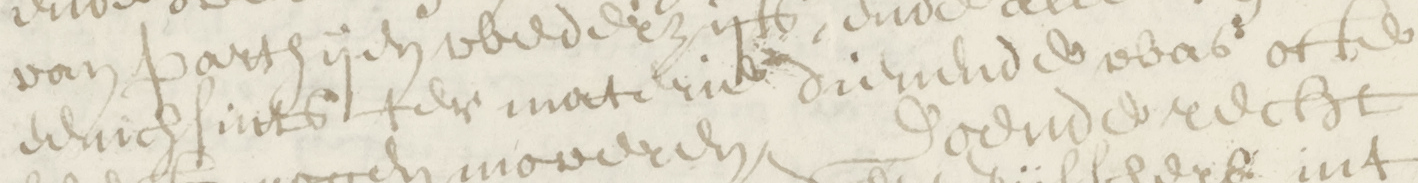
eenichsints ter materie dienende was ofte
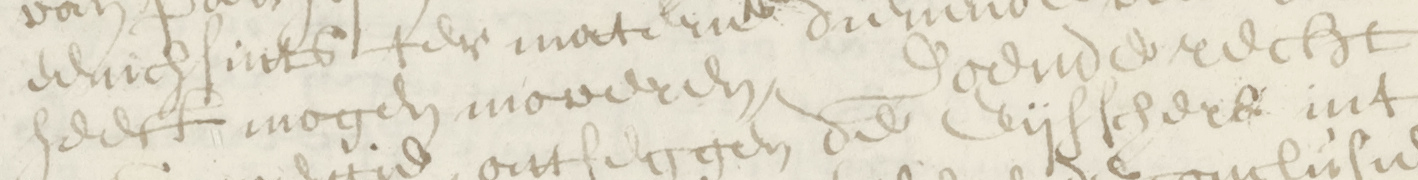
heeft mogen moveren. Doende recht
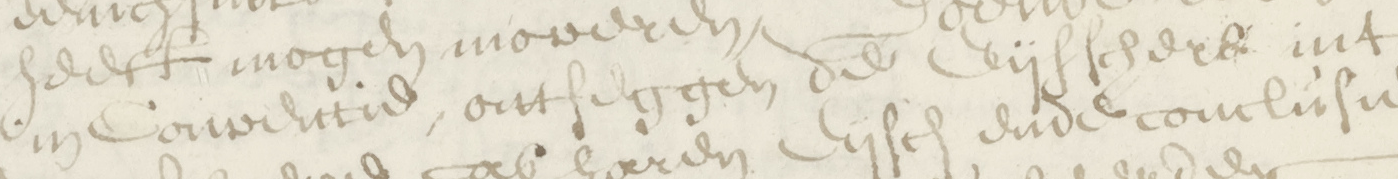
in Conventie, ontseggen de Eijsschers int
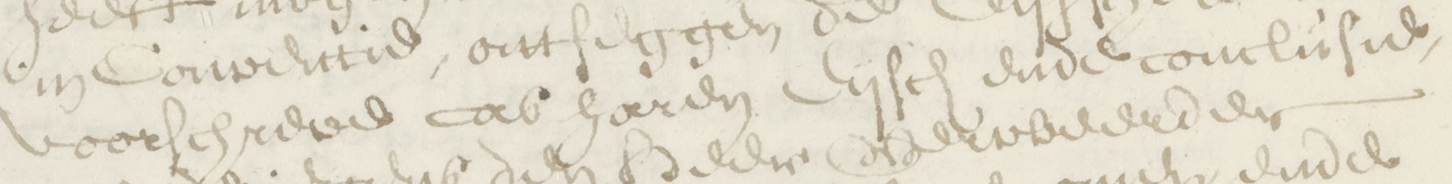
voorschreve cas haren Eijsch ende conclusie,
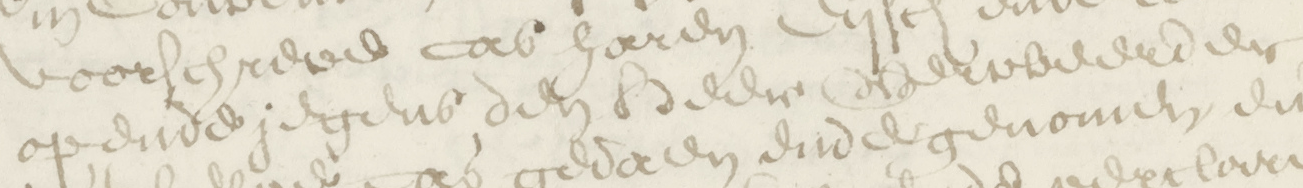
op ende jegens den Heer Verweerder
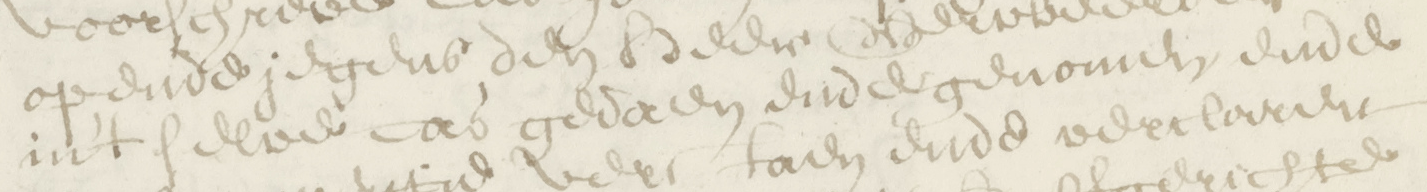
in't selve cas gedaen ende genomen, ende
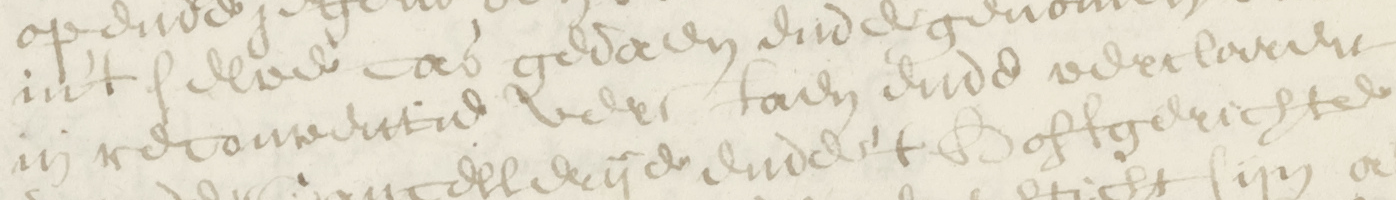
in reconventie verstaen ende verclaren
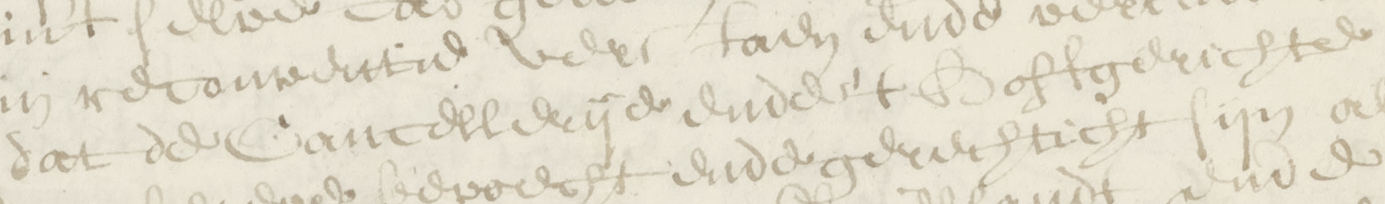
dat de Cancellerije ende 't Hoffgerichte
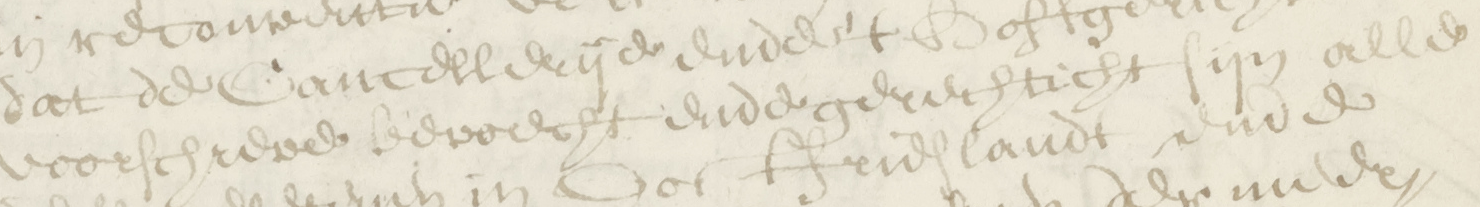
voorschreve bevoecht ende gerechticht sijn alle
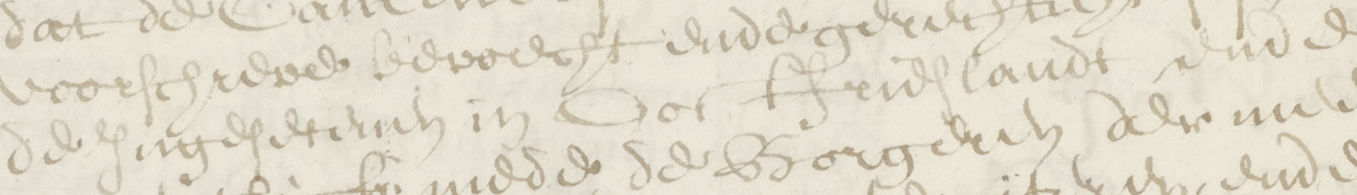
de Ingesetenen in Oostfrieslandt ende
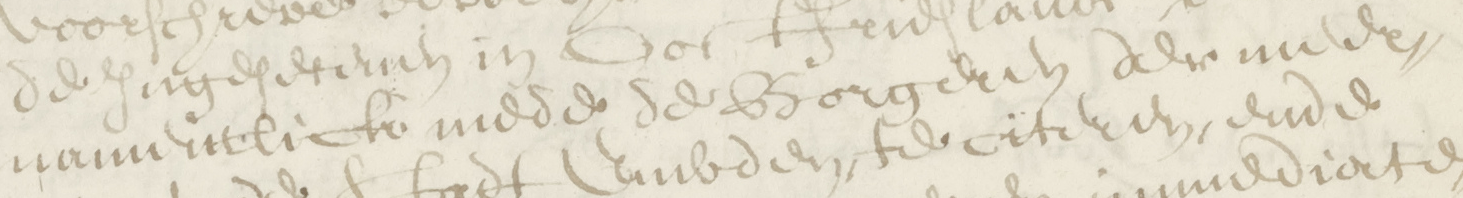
namentlick mede de Borgeren der meer„
